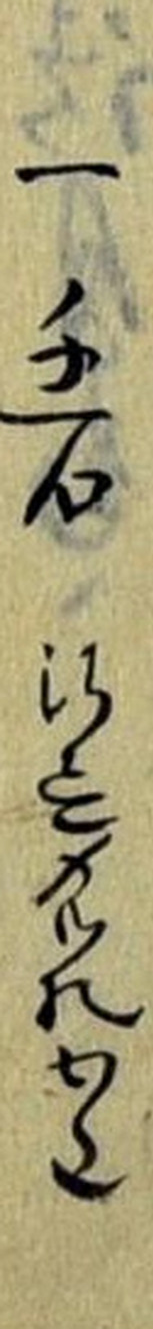一千石銀壱貫弐拾五匁
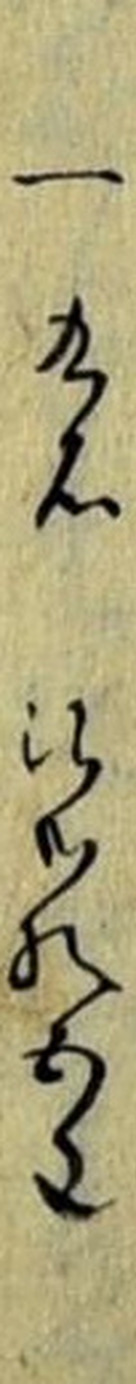一九石銀弐拾五匁
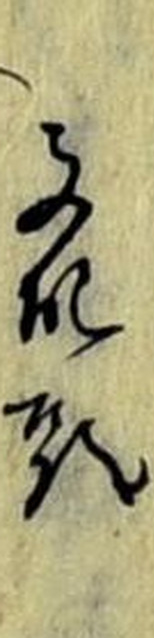支配頭
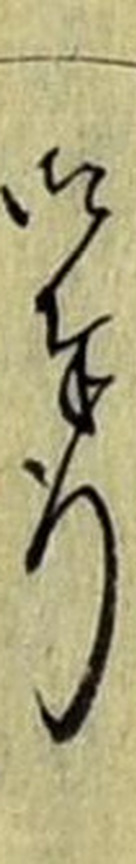御奉行
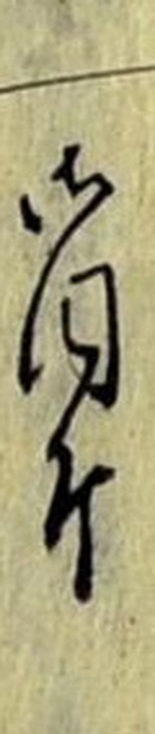御目付
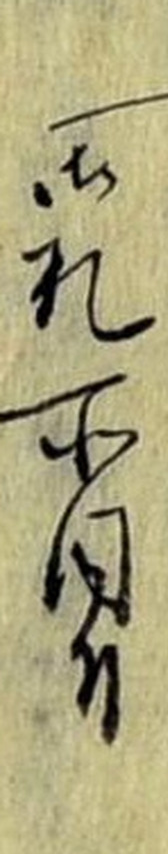御札所目付
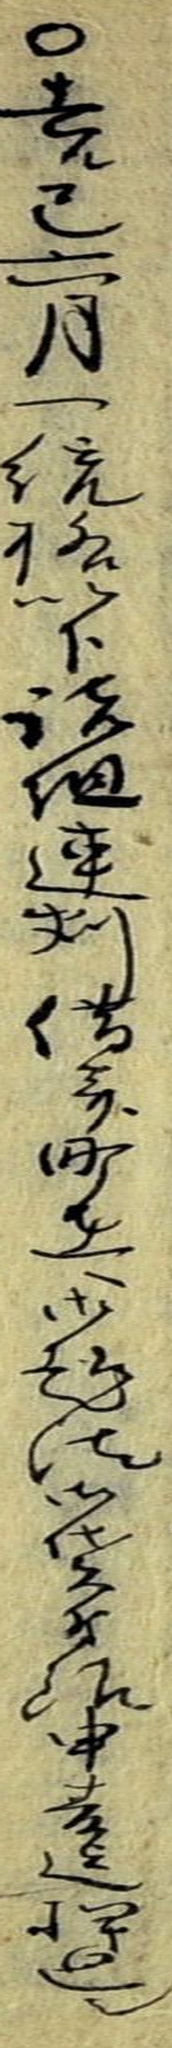○去巳六月一統格以下諸組連判借并町在へ御趣法御貸付銀申春迄押廻し
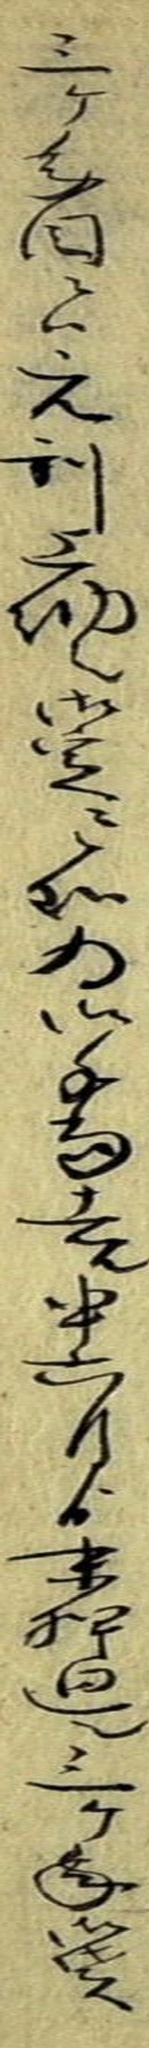三ヶ年目には元利上納之御定に候処為御手当去ル申六月ゟ末押廻し三ヶ年御貸
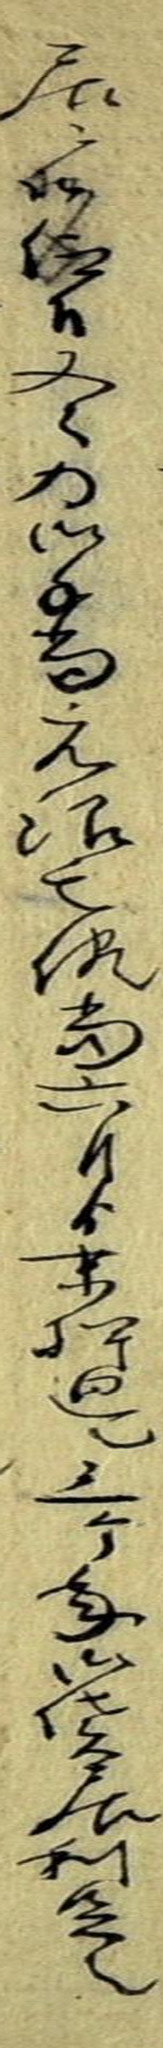居に被仰付又々為御手当元銀其侭当六月ゟ末押廻し三ヶ年御貸居利息之
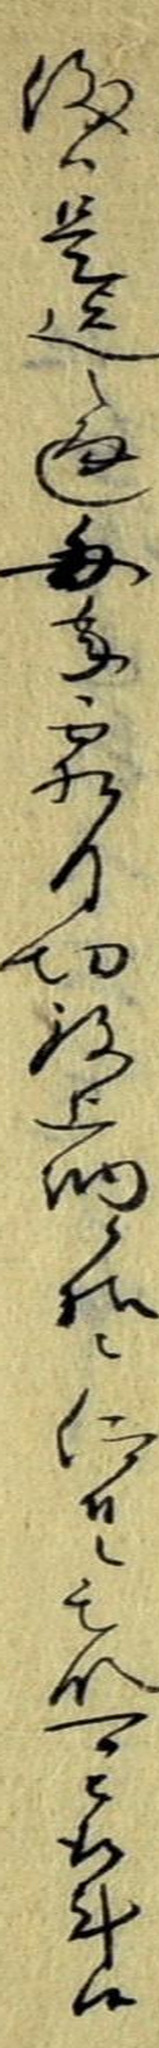儀は是迄之通毎年霜月切致上納候様被仰付候其段可被取斗候

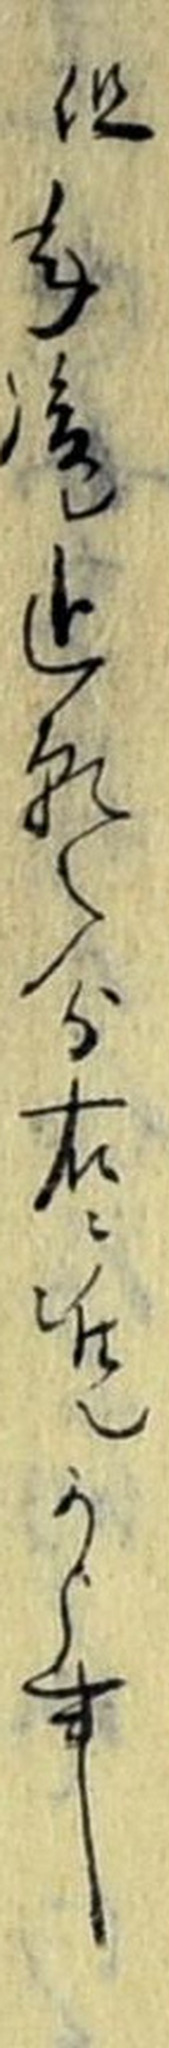但年後レ追願之分右に准し可申事
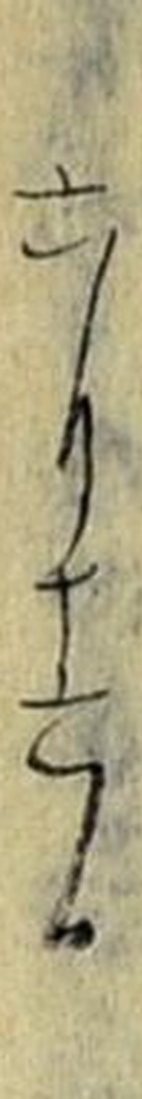六月十六日
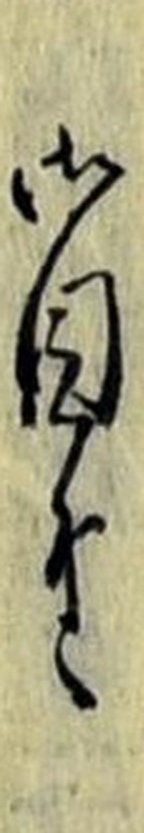御目付へ
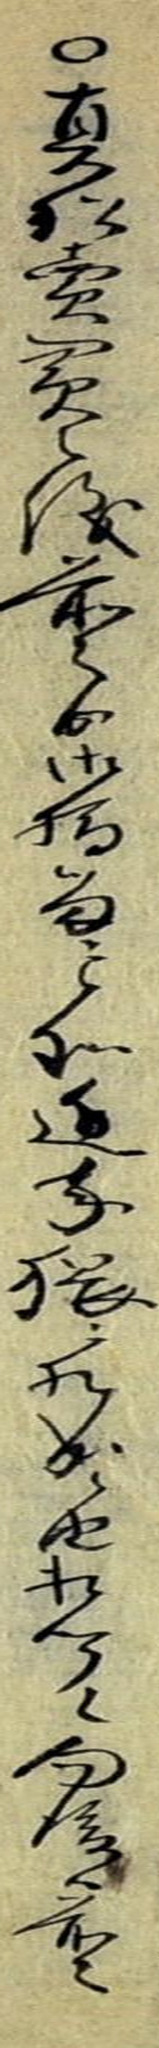○真松売買之儀前々ゟ御指留に候処近年猥に相成候由相聞候向後は前々
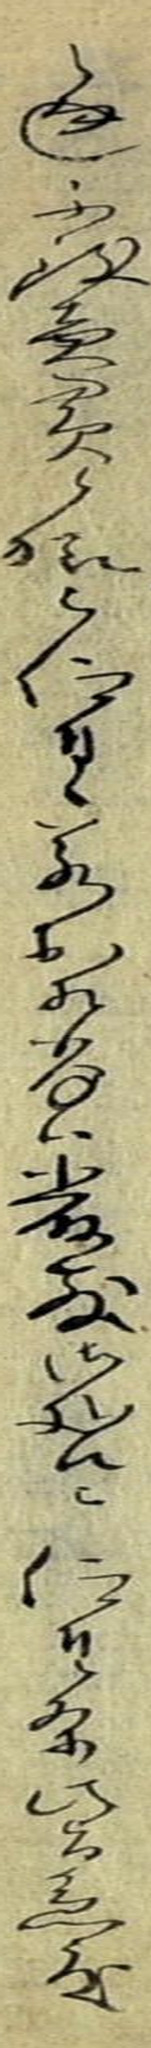之通不致売買候様被仰付候若於相背は厳敷御咎被仰付候条此旨急度
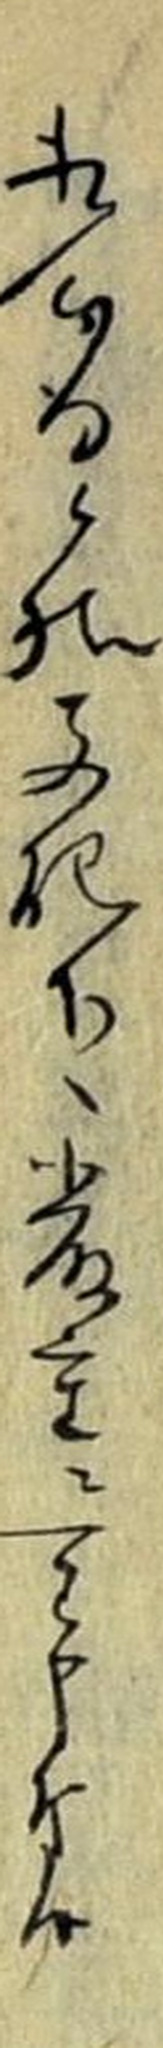相心得候様支配下へ厳重に可申付候
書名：命令之部 四
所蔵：福井県文書館 Fukui Prefectural Archives
